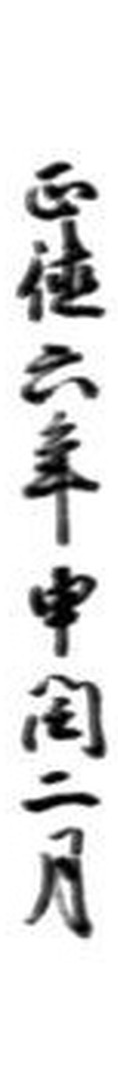正徳六年申閏二月
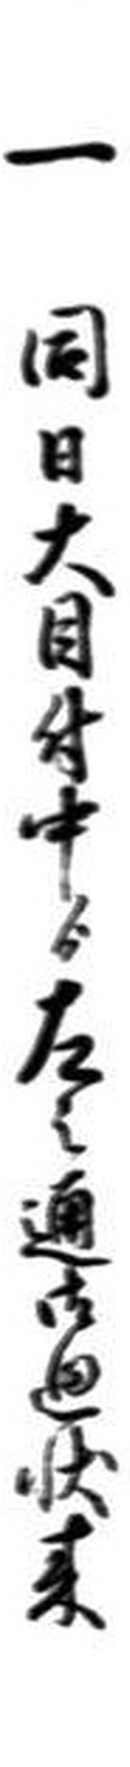一同日大目付中ゟ左之通御廻状来
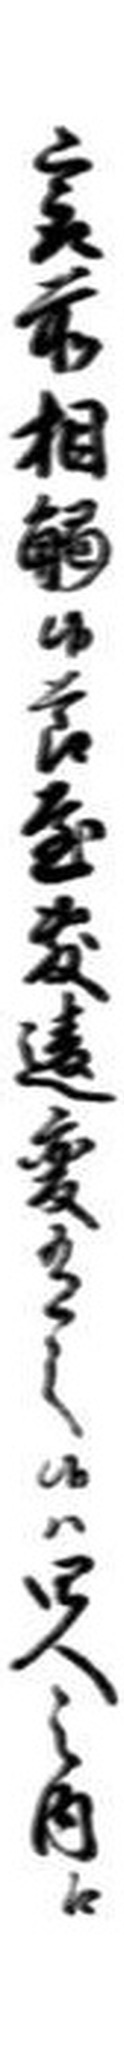最前相触候節屋敷違変有之候ハ四人之内江

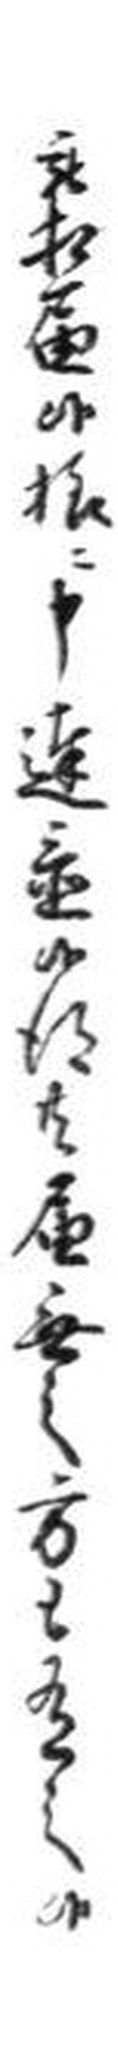被相届候様ニ申達置候得共届無之方も有之候
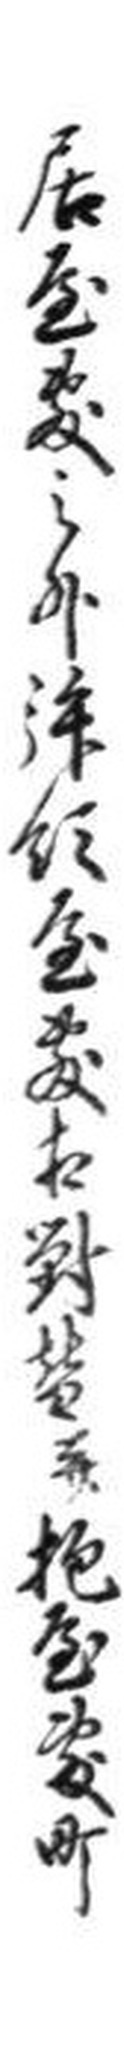居屋敷之外拝領屋敷相対替并抱屋敷町
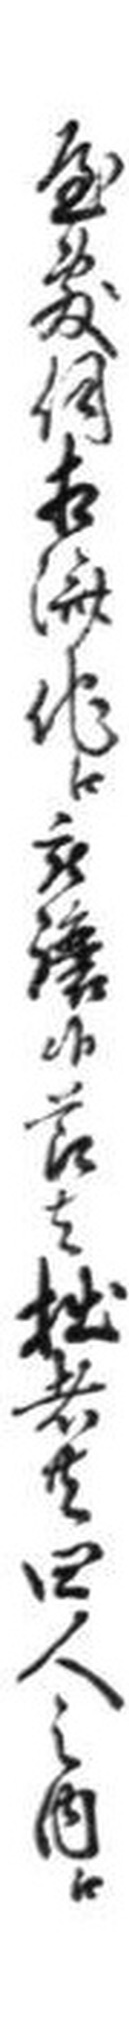屋敷伺相済他江被譲候節者拙者共四人之内江
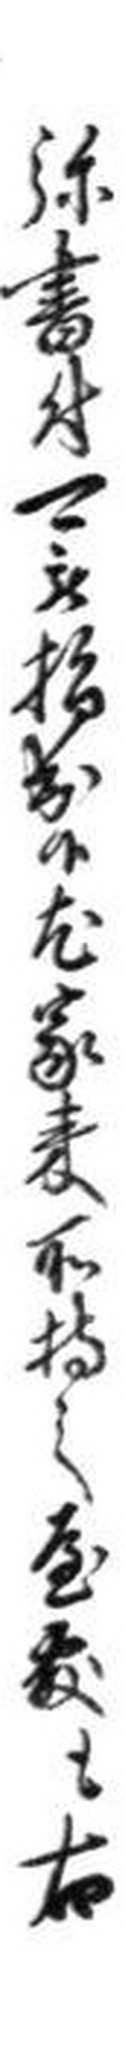弥書付可被指出候尤家来所持之屋敷も右
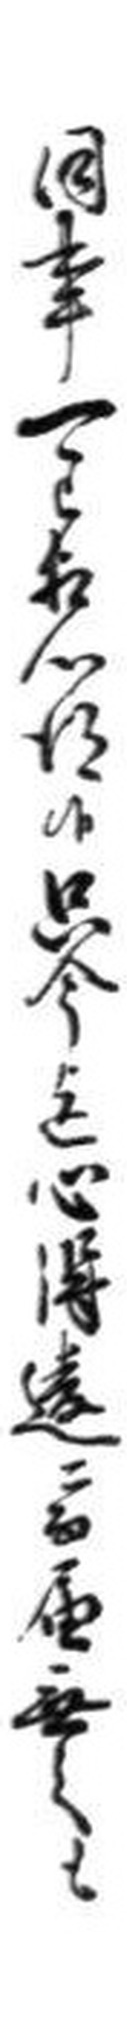同事可被相心得候只今迄心得違ニ而届無之も
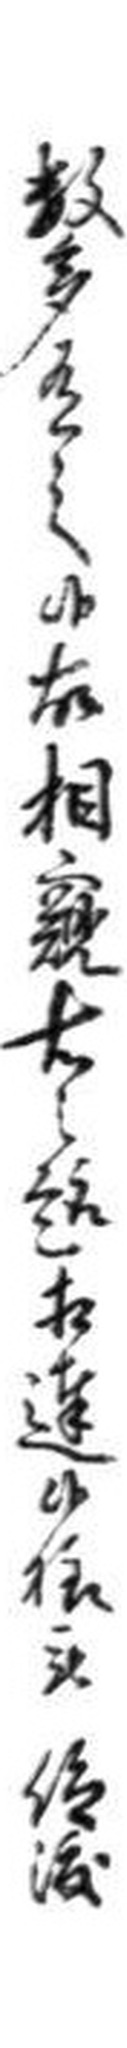数多有之候故相窺右之趣相達候様被仰渡
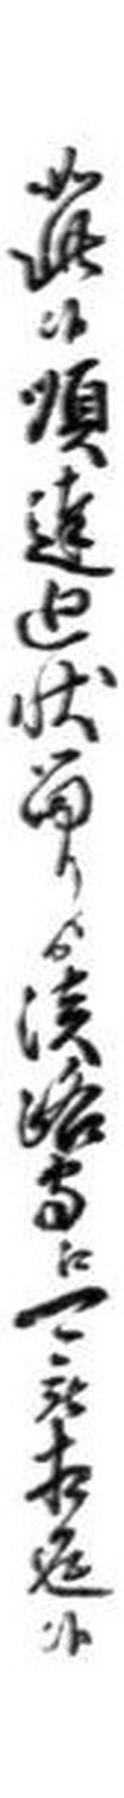如此順達廻状留りゟ淡路守江可被相返候
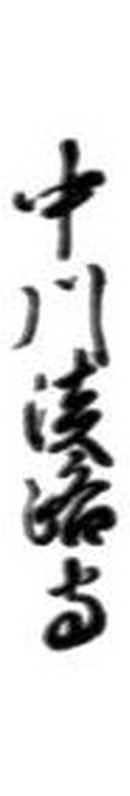中川淡路守
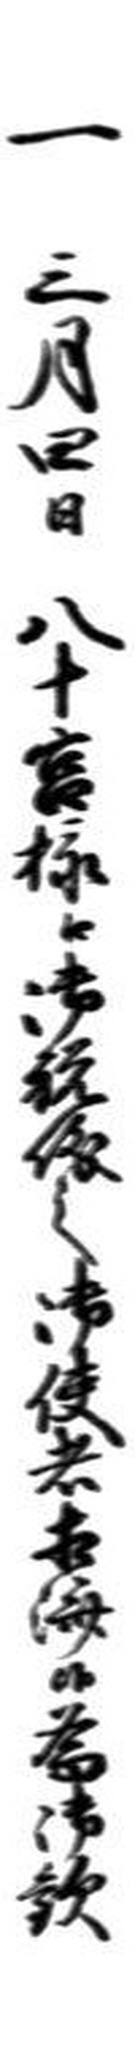一三月四日八十宮様江御祝儀之御使者相済候為御歓
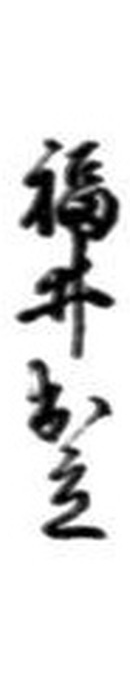福井出立
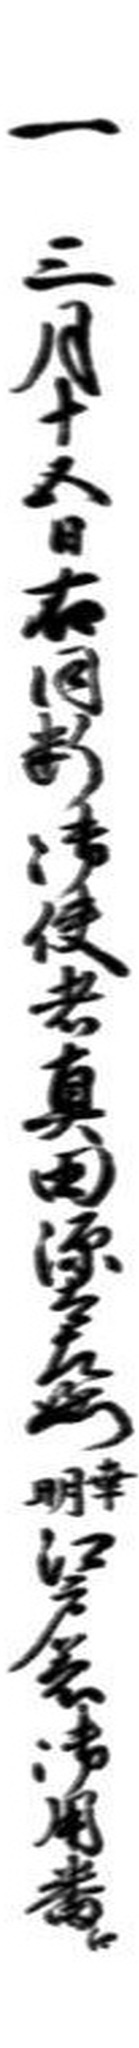一三月十五日右同断御使者真田源太左衛門幸明江戸着御用番江
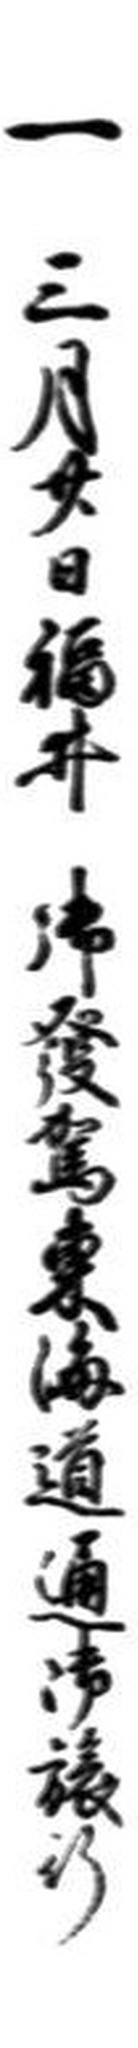一三月廿日福井御発駕東海道通御旅行

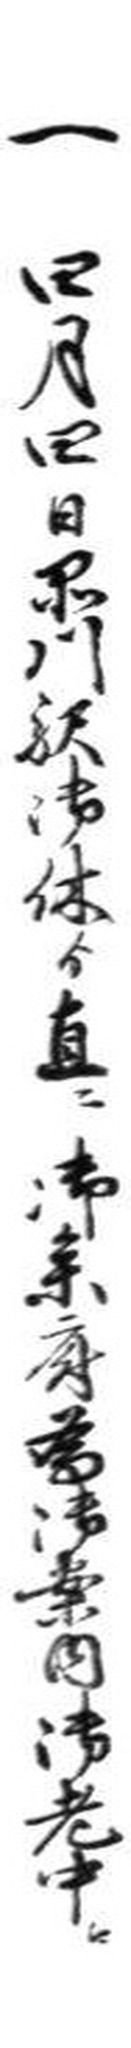一四月四日品川駅御休ゟ直ニ御参府為御案内御老中江
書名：家譜 三十一 吉邦公 享保元年
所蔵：福井県文書館 Fukui Prefectural Archives
